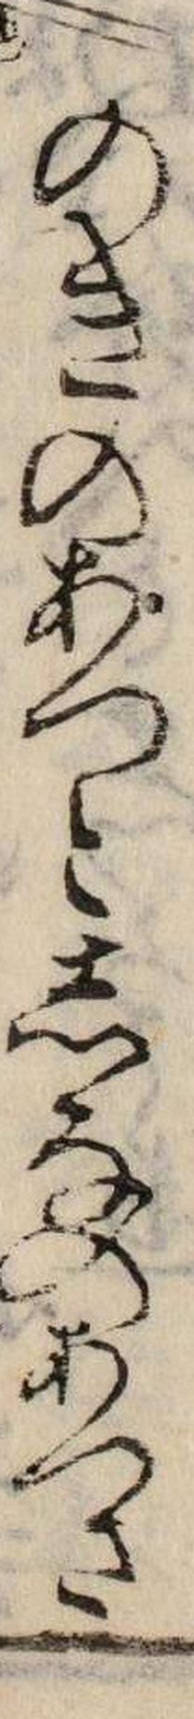のきのあつとしなのあつさ
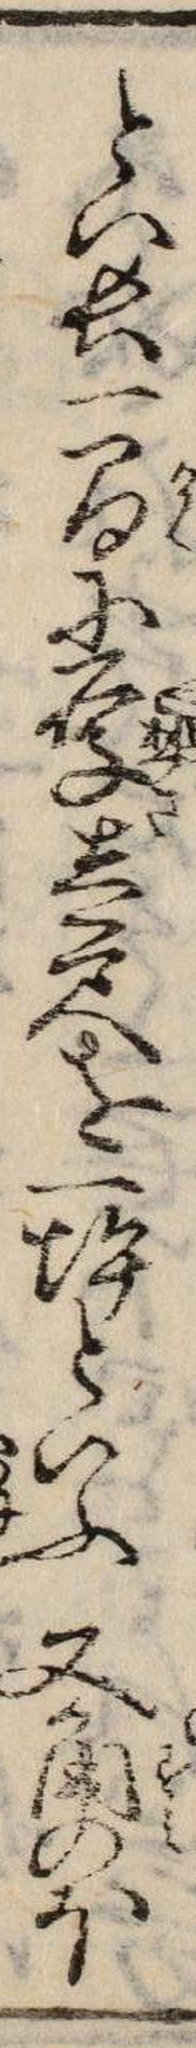とは長一間に厚壱尺を一坪といふ又角のほ
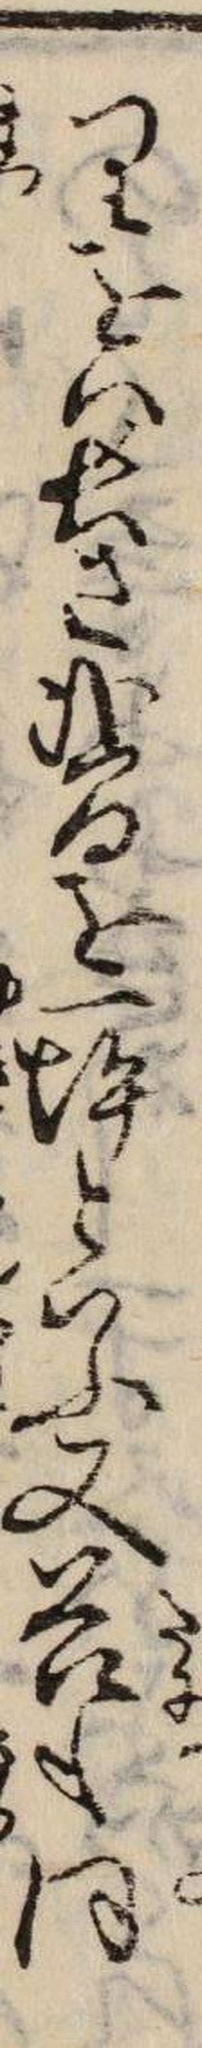りをは長さ弐間を一坪といふ又谷も同
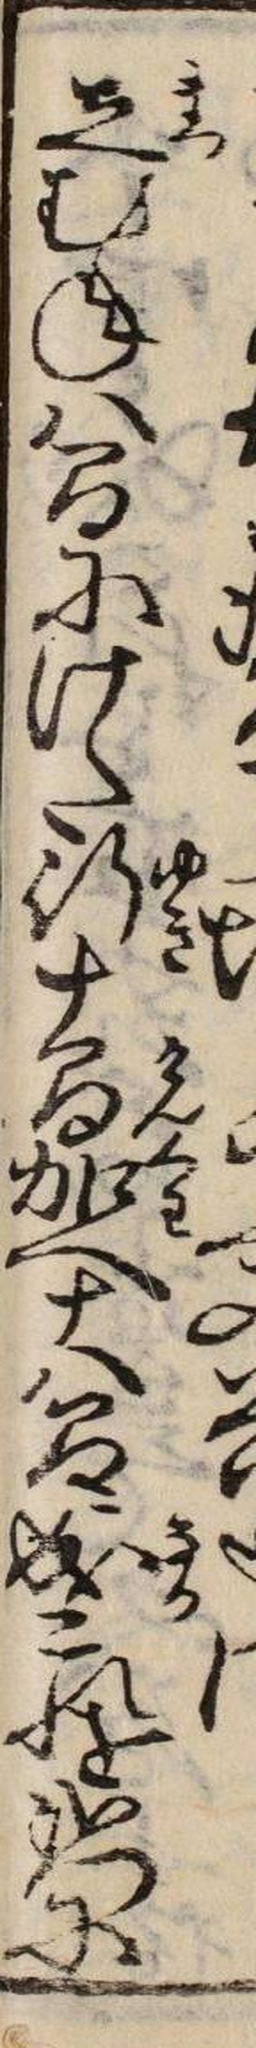先むね八間にけた行十間加へ十八間成これを弐つに
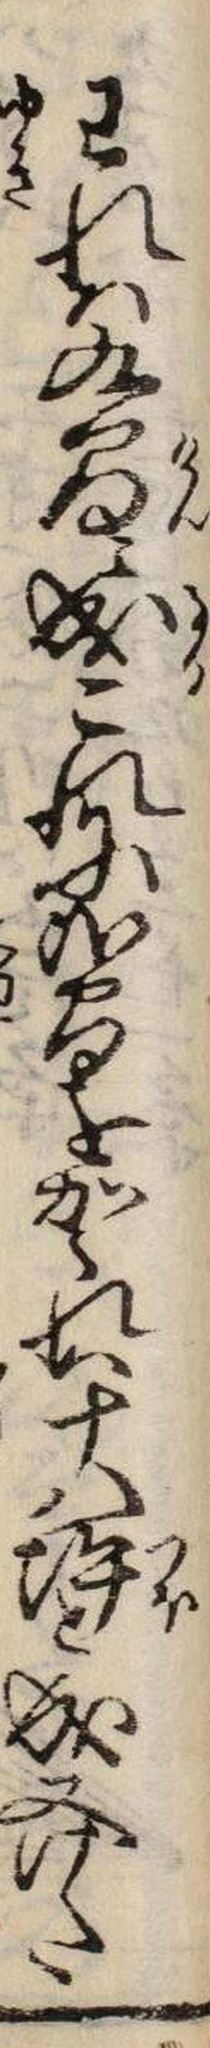われは九間成これに弐間をかくれは十八坪と成又けた
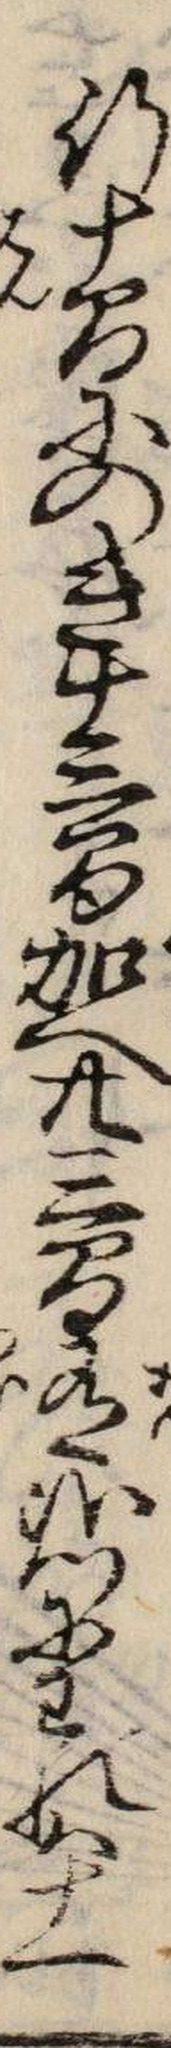行十間にのき十三間加へ廾三間有弐つにわれは十一
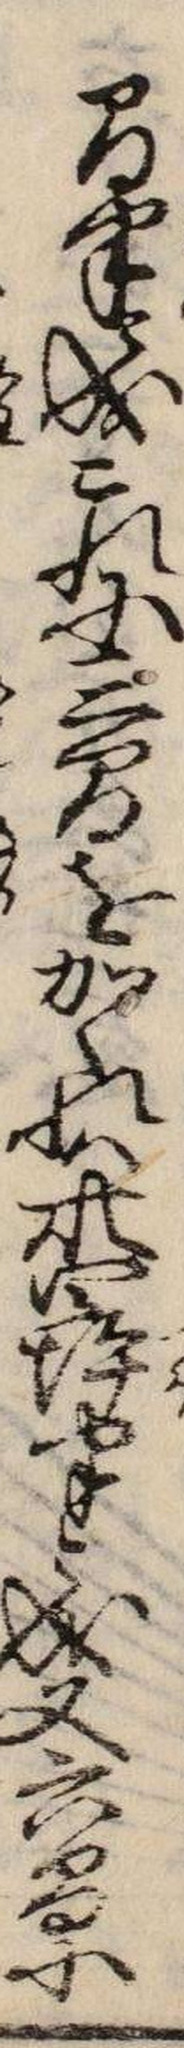間半成これに三間をかくれは卅四坪半と成又六間に
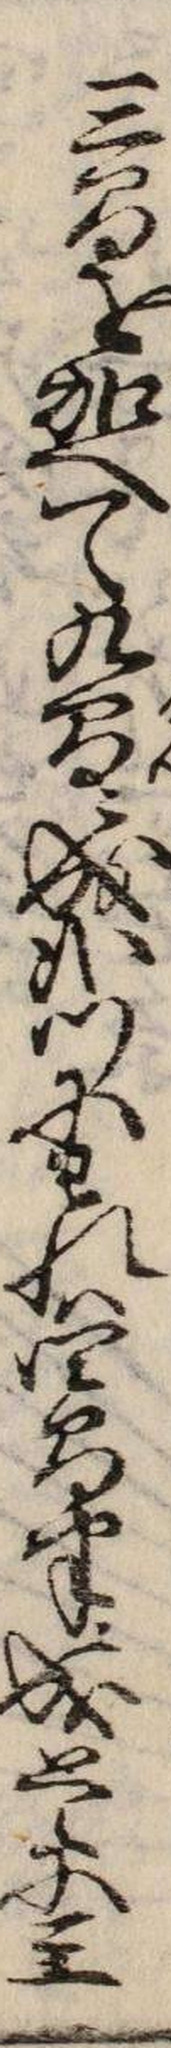三間を加へて九間成弐つにわれは四間半成是に三
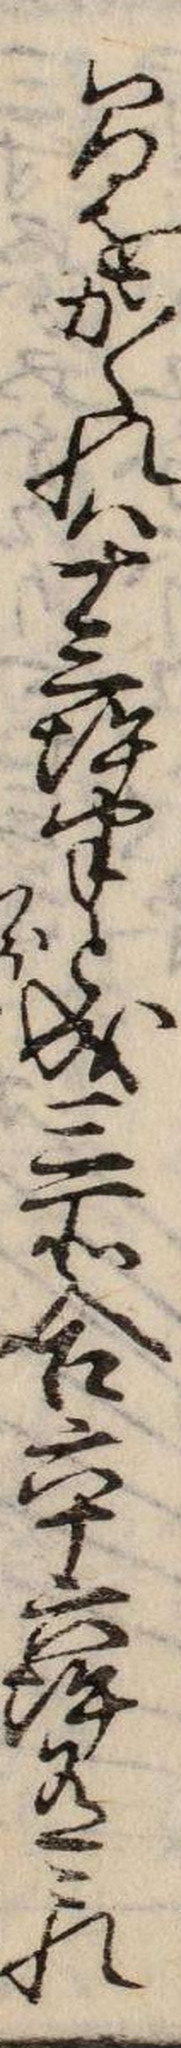間をかくれは十三坪半と成三所合六十六坪有これ
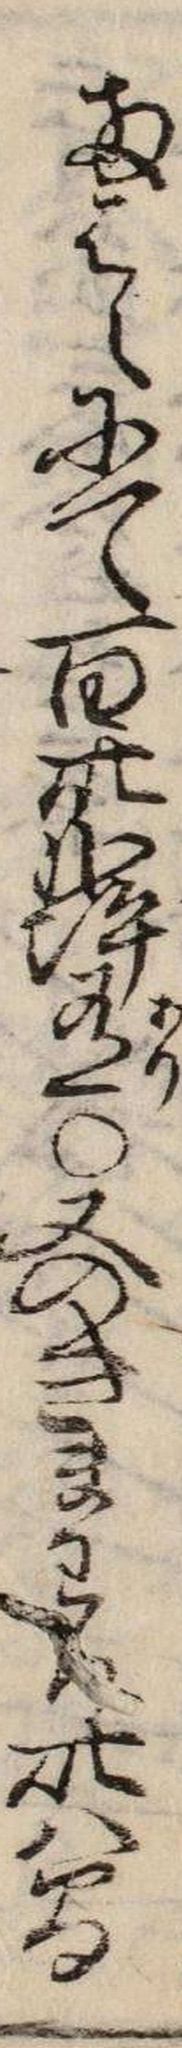両はゝにて百卅弐坪有○又のきまわり卅八間
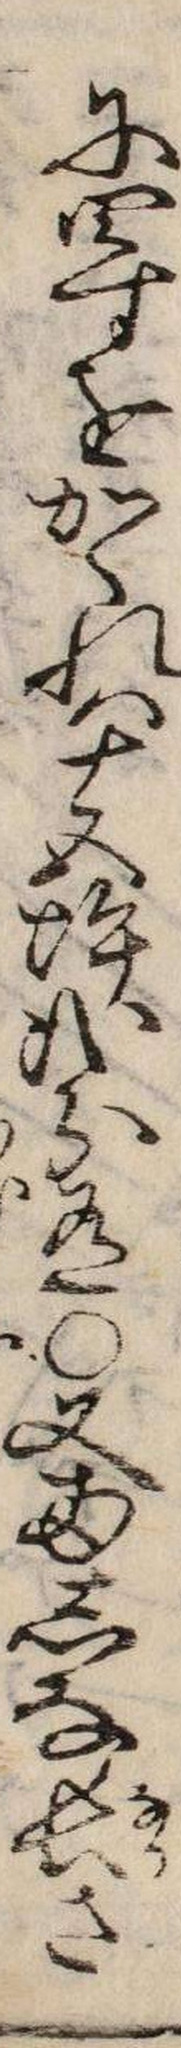に四寸を隠れは十五坪弐分有○又両しな長さ
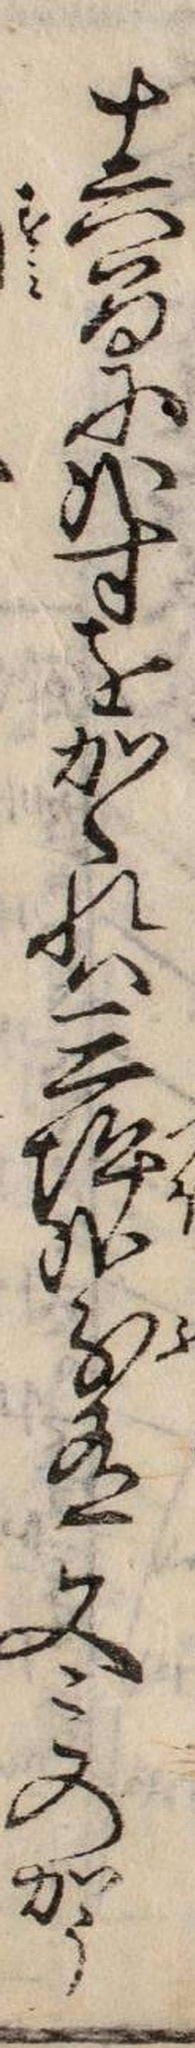十六間に弐寸をかくれは三坪弐分有又この加う
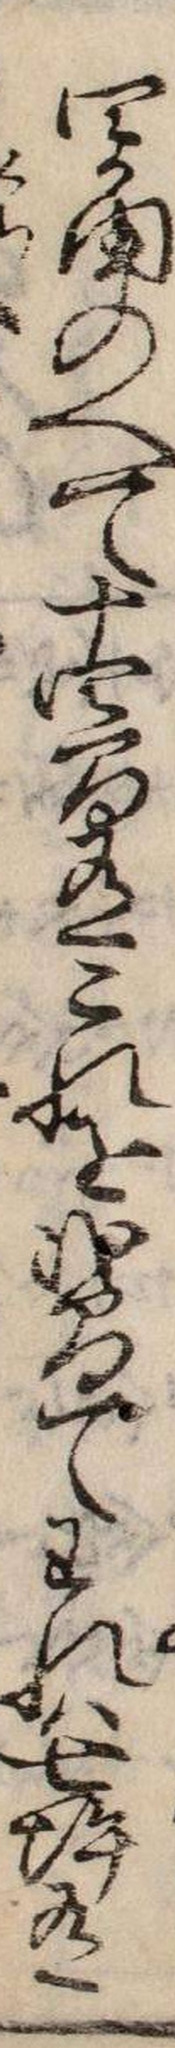四角のへて十四間有これを弐間てわれは七坪有
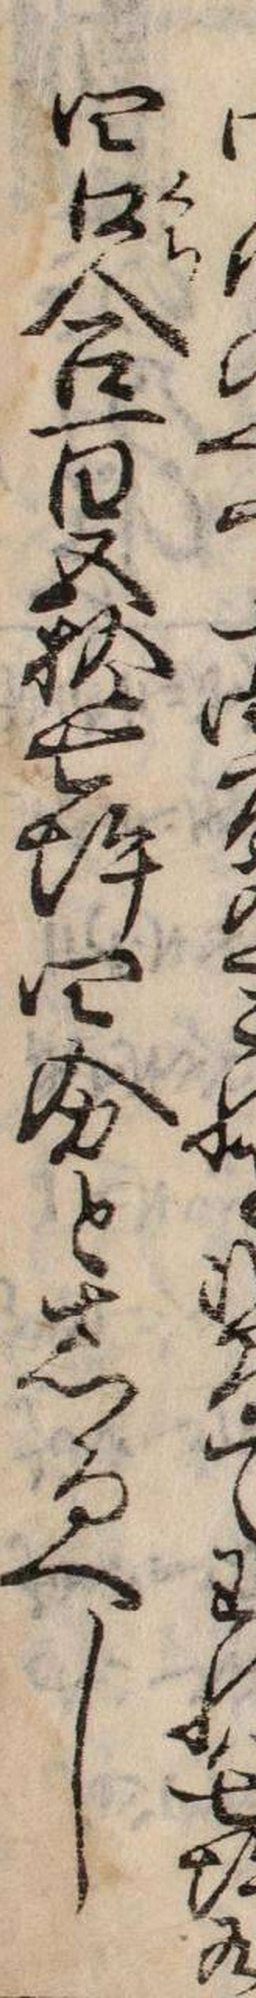四口合百五拾七坪四分としるへし

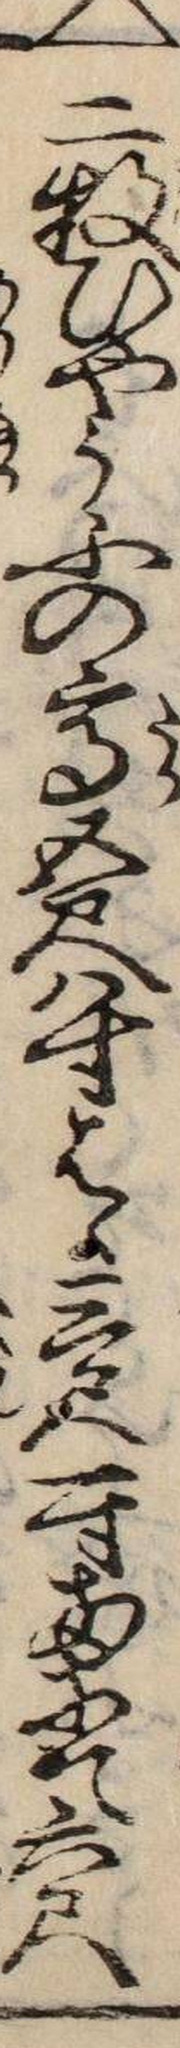△二枚ひやうふの高五尺八寸はゝ三尺一寸両にて六尺
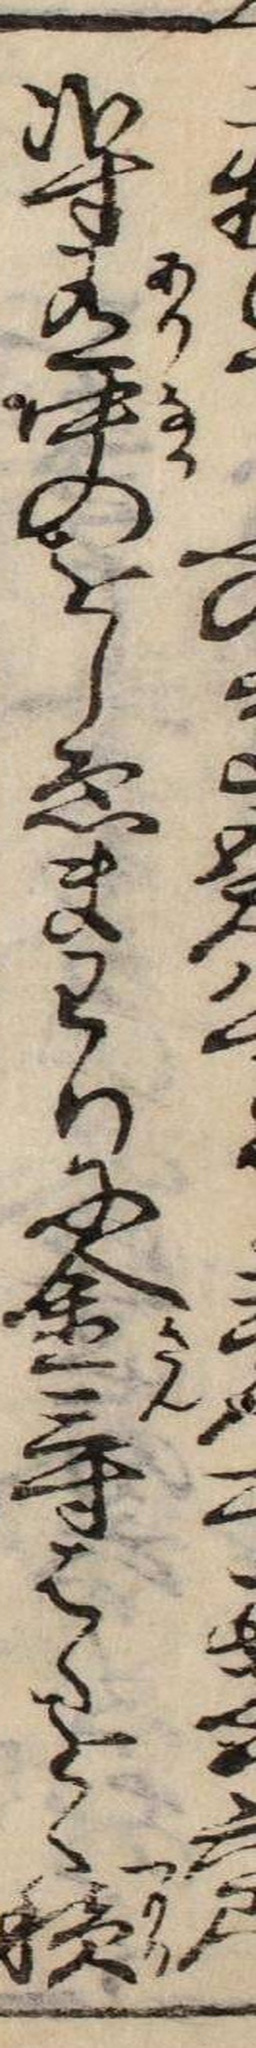弐寸有中のをしゑまわりに金三寸はくをく積
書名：塵劫記（寛永11年自跋、京都府立京都学・歴彩館追貴8）
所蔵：京都府立京都学・歴彩館 国文学研究資料館
